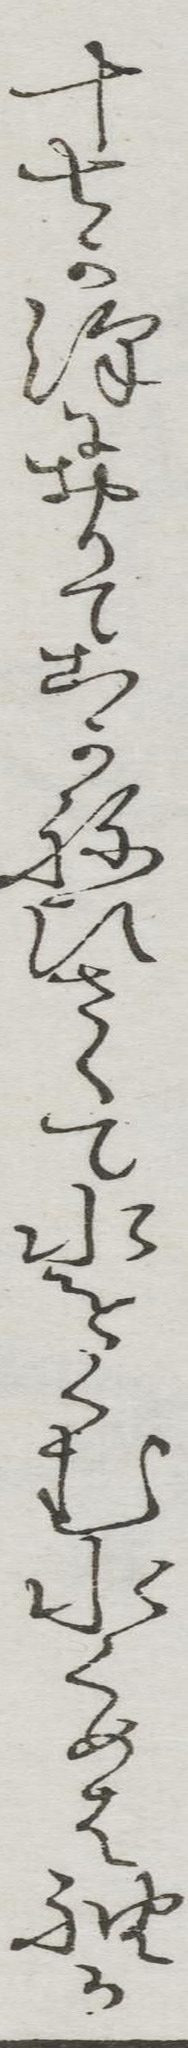十七か沢におりてこかねひさくて水をくむ水くめは袖か
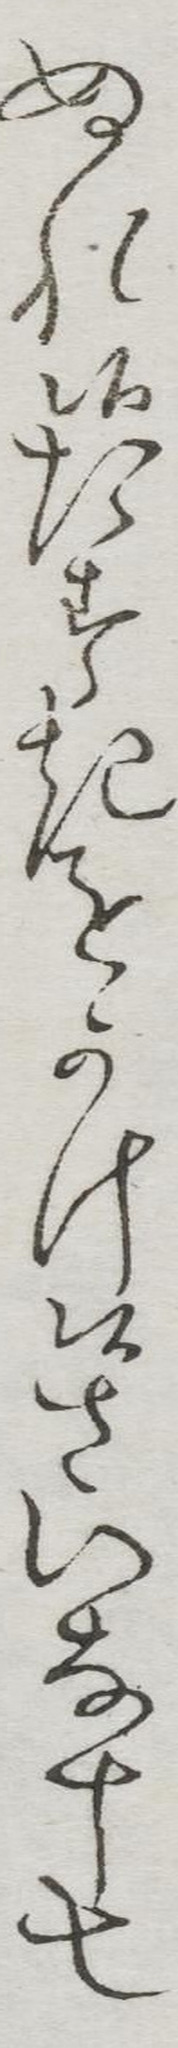ぬれ候たすきをかけ候さいな十七
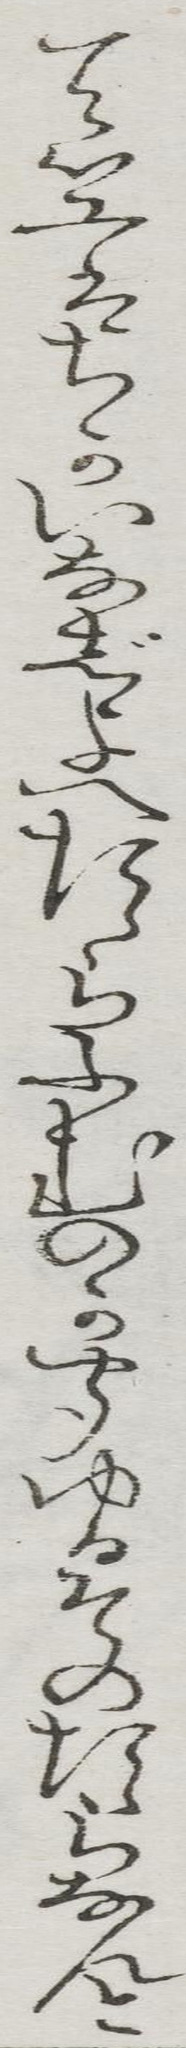天竺はちかいなじよへたゝらふむのか聞ゆるそのたゝらなんと
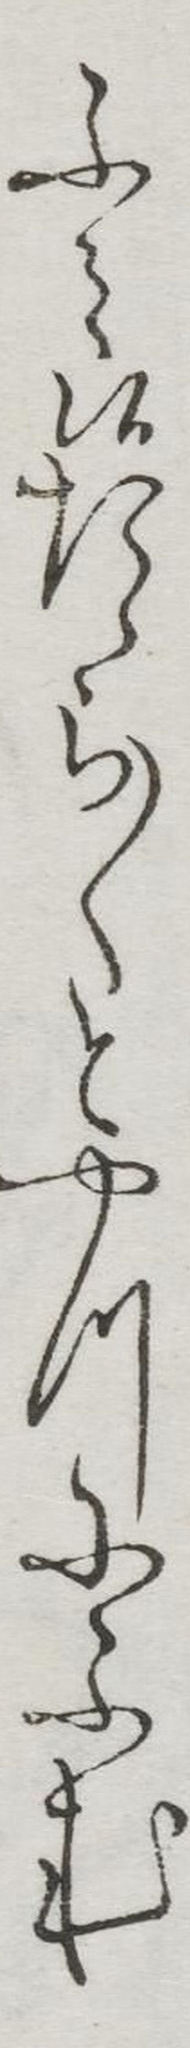ふみたゝら〳〵とやつにふむ
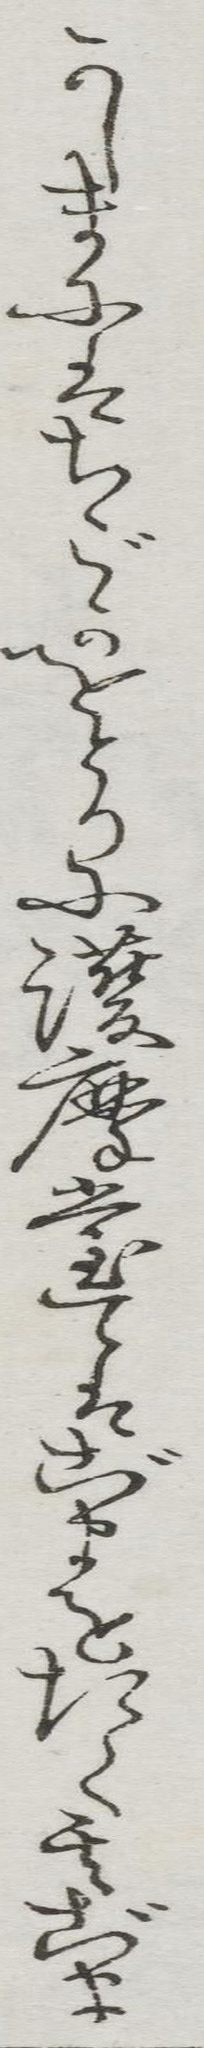かしまにはちごかをとりに護摩堂てはごまをたく其ごま
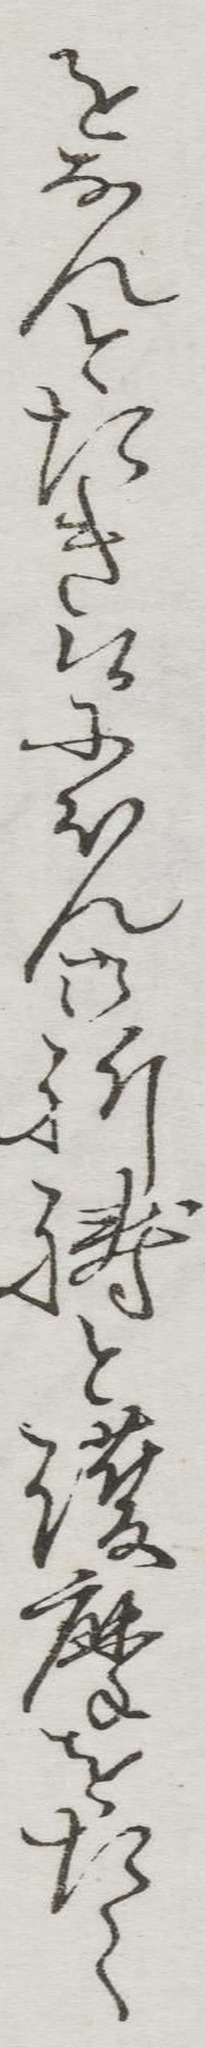をなんとたき候にほん御祈祷と護摩をたく
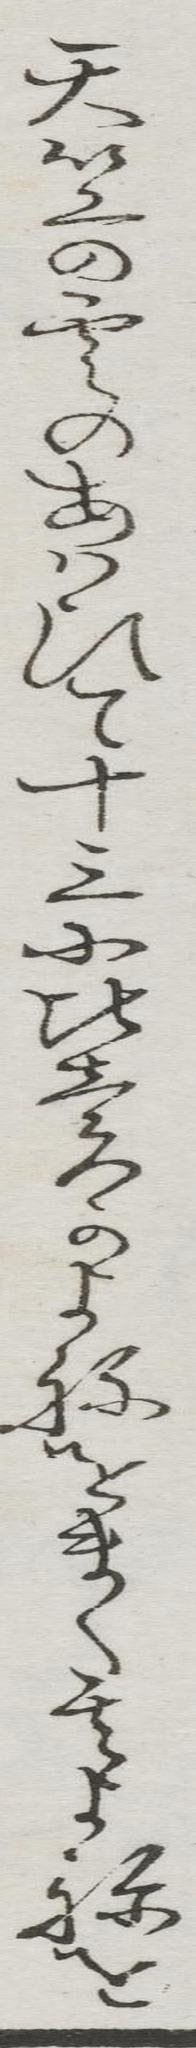天竺の雲のあはひと十三に比売かよねをまく其よねを
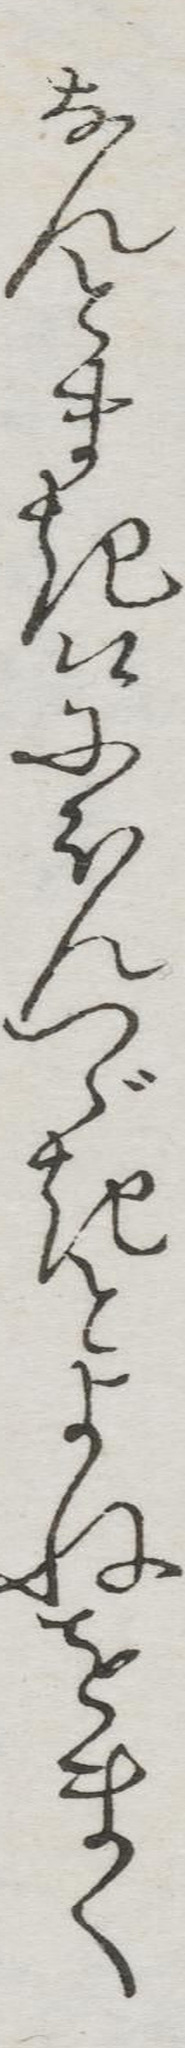なんとまき候にほんつゞきとよねをまく
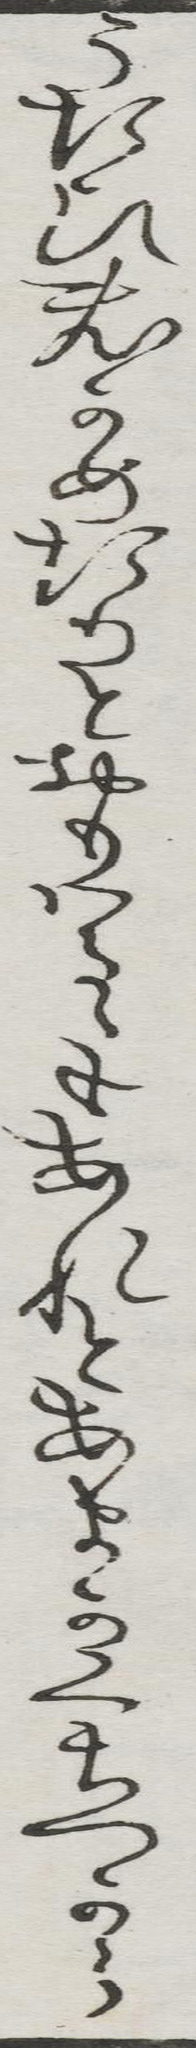うたひめかめたりとおもはるゝもあれとあまかくちつから
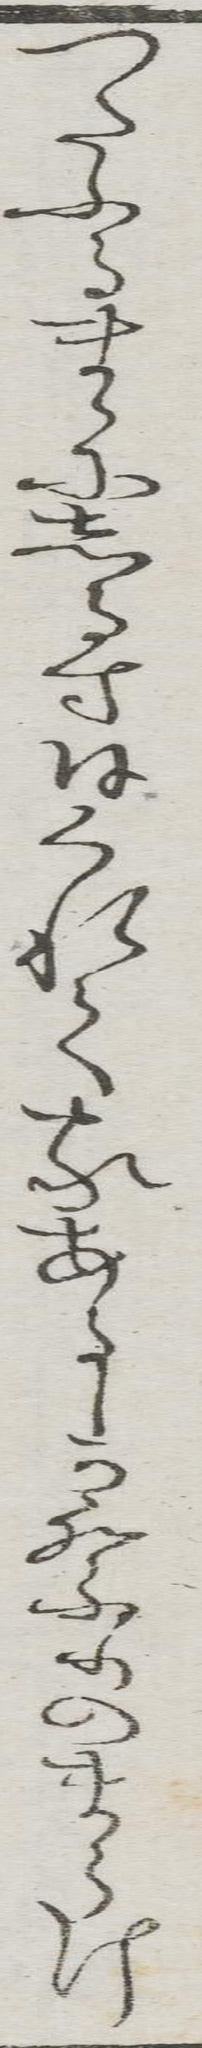つたふるまゝにしるす日くれて家あるしか祭りのまうけ
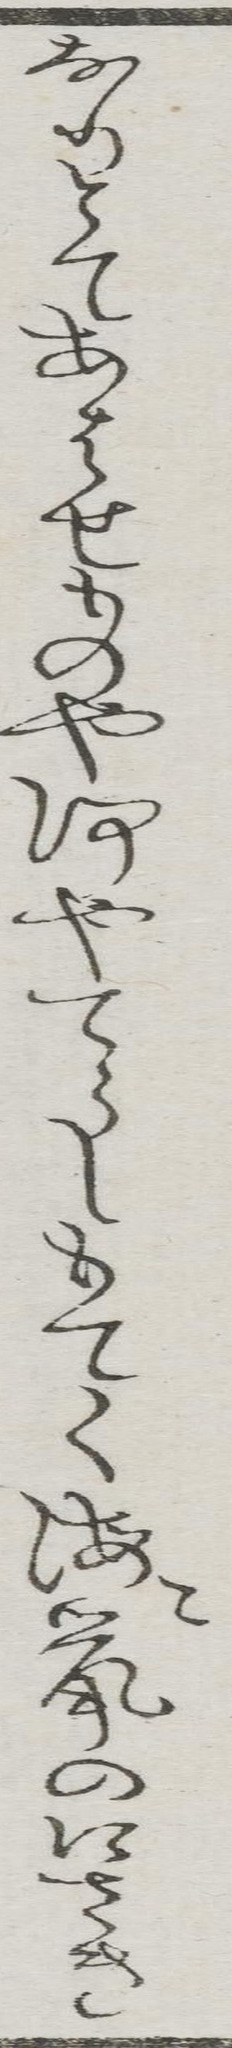なりとてあはせものや何やてうしもてく海鼠の口さき
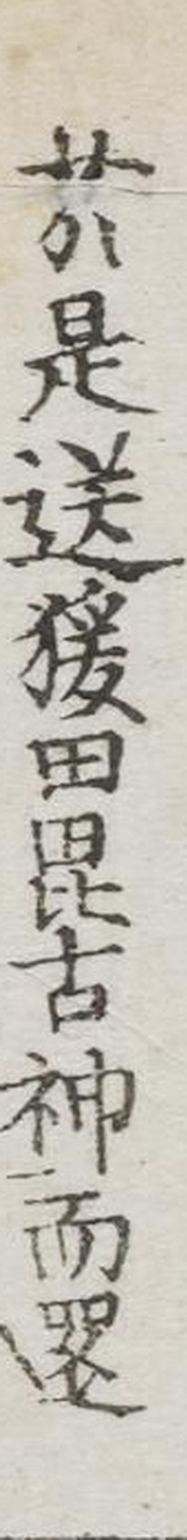於是送猨田毘古神而還
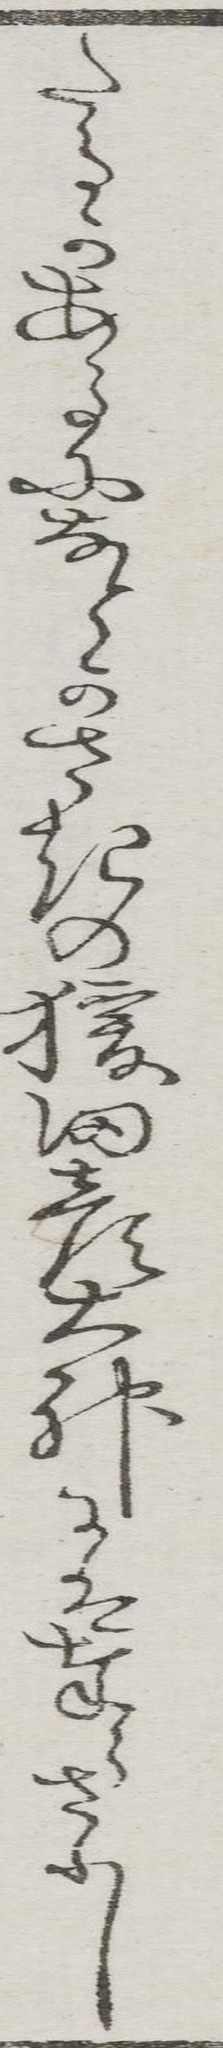たるかあるになとかさきの猿田彦大神にそ奉らさりし
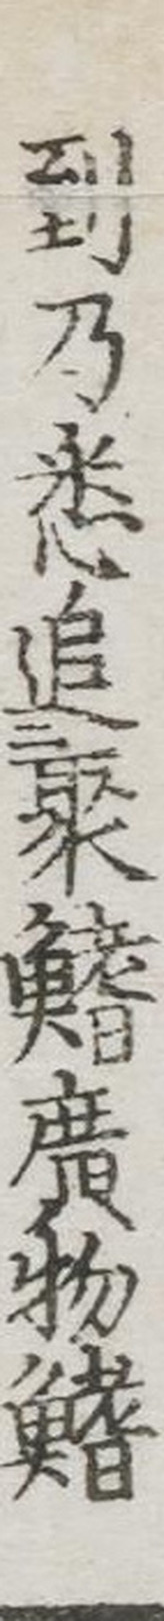到乃悉追聚鰭広物鰭
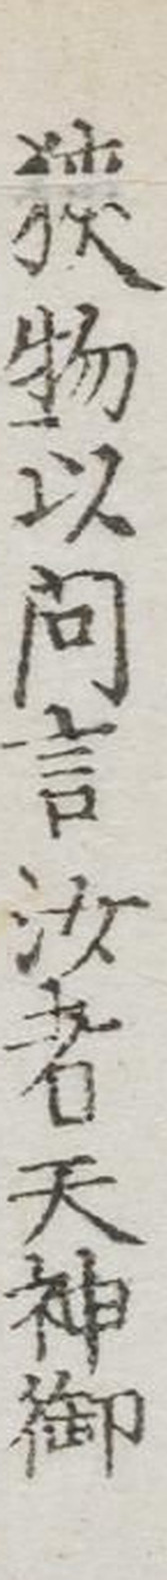狭物以問言汝者天神御
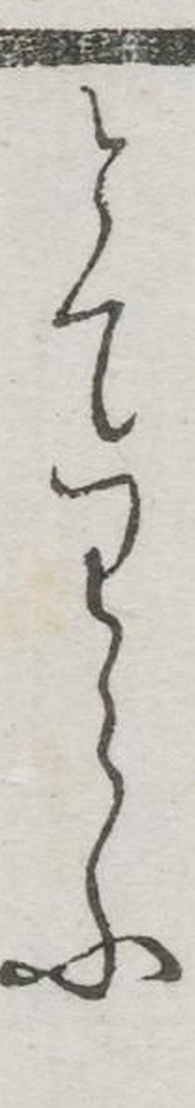とてわらふ
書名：挿画熱海日記　全
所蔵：東京大学地震研究所図書室 Earthquake Research Institute Library, The University of Tokyo, JAPAN
